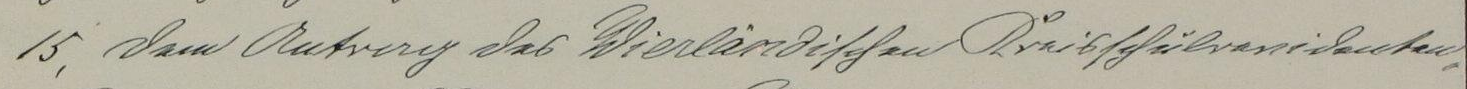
15. Dem Antrag des Wierländischen Kreisschulrevidenten,
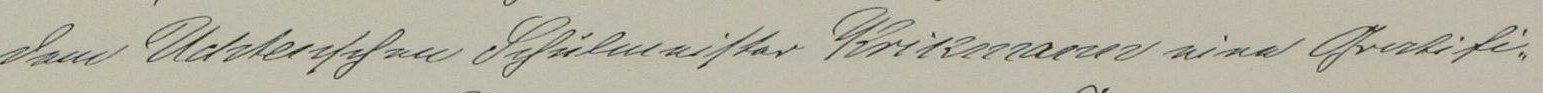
dem Uchtenschen Schulmeister Krikmann eine Gratifi-
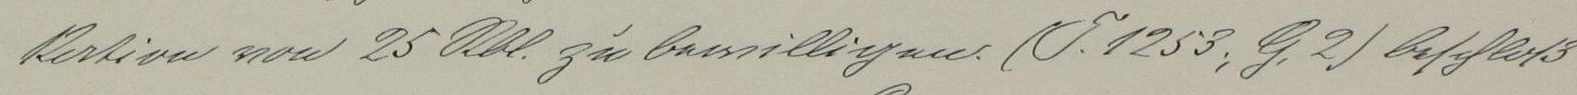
kation von 25 Rbl. zu bewilligen (T.1253; G.2) beschloß
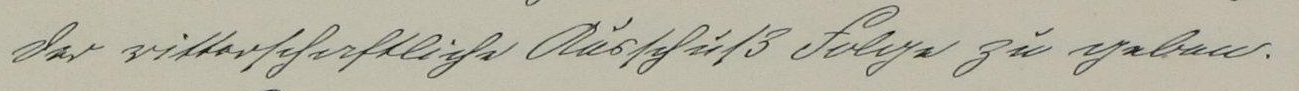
der ritterschaftliche Ausschuß Folge zu geben.
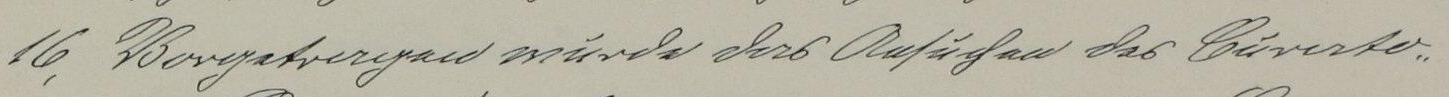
16. Vorgetragen wurde das Ansuchen des Curato-
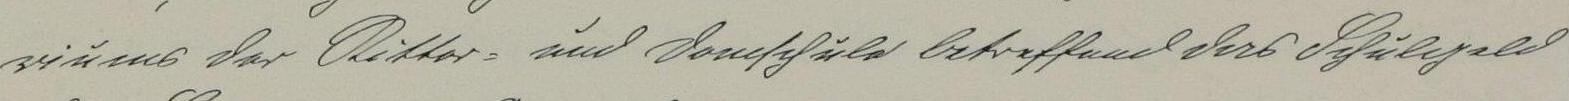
riums der Ritter- und Domschule betreffend das Schulgeld
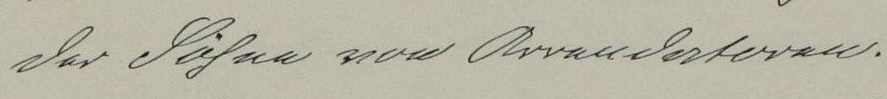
der Söhne von Arrendatoren.
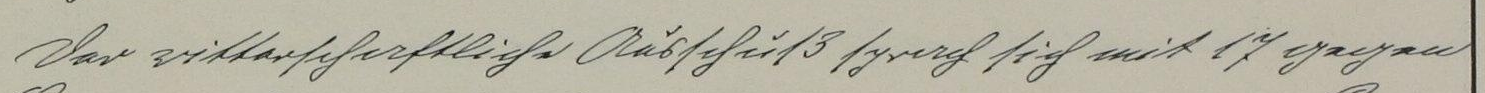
Der ritterschaftliche Ausschuß sprach sich mit 17 gegen
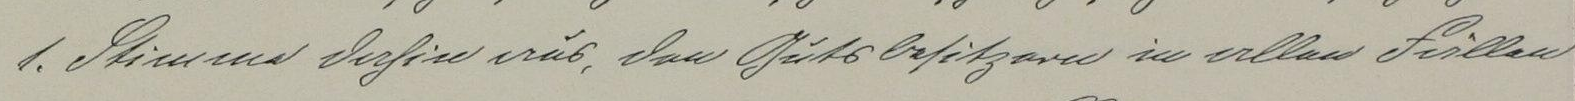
1 Stimme dahin aus, den Gutsbesitzern in allen Fällen
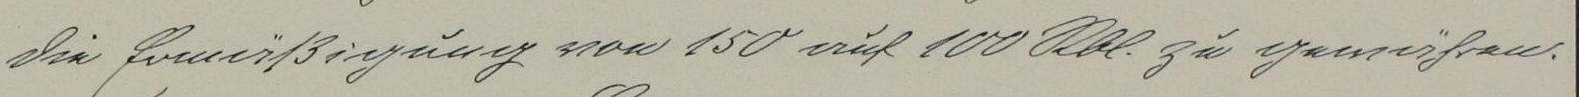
die Ermäßigung von 150 auf 100 Rbl. zu gewähren.
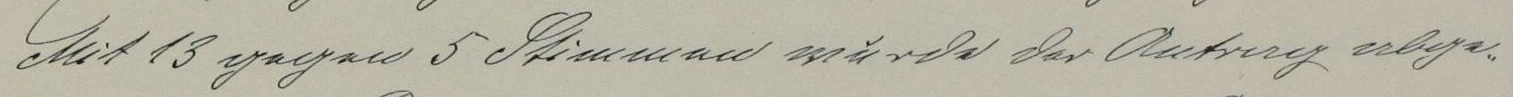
Mit 13 gegen 5 Stimmen wurde der Antrag abge-
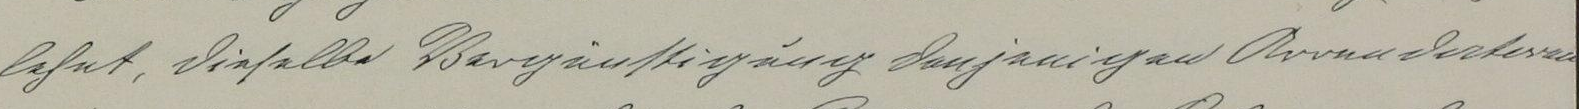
lehnt, dieselbe Vergünstigung denjenigen Arrendatoren
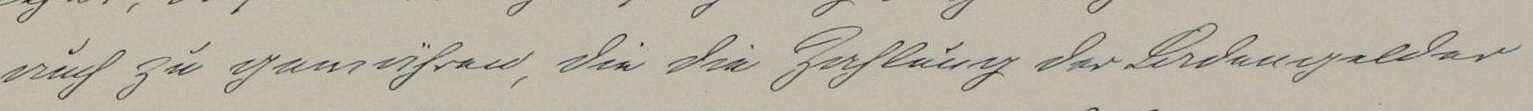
auch zu gewähren, die die Zahlung der Ladengelder
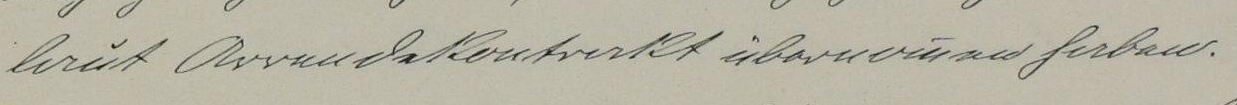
laut Arrendekontrakt übernommen haben.
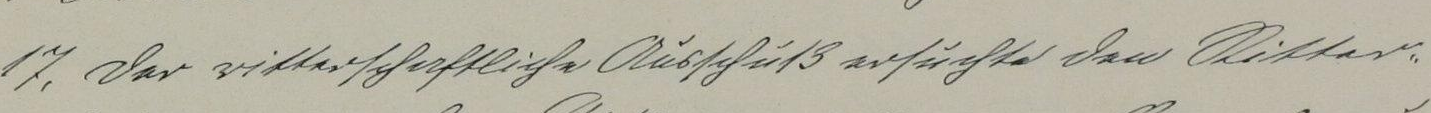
17. Der ritterschaftliche Ausschuß ersuchte den Ritter-
